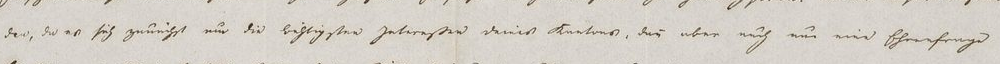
den, da es sich zunächst um die wichtigsten Intereßen Deines Kantons, dann aber auch um eine Ehrenfrage
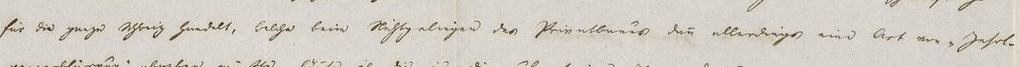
für die ganze Schweiz handelt, welche beim Nichtgelingen des Privatbaues dann allerdings eine Art von «Insol-
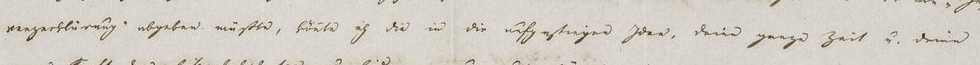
venzerklärung» abgeben müßte, könnte ich die in Dir aufgestiegne Idee, Deine ganze Zeit u. Deine
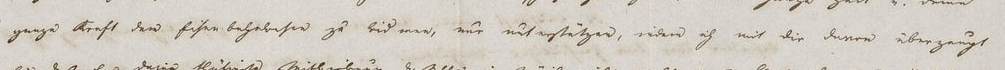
ganze Kraft dem Eisenbahnwesen zu widmen, nur unterstützen, indem ich mit Dir davon überzeugt
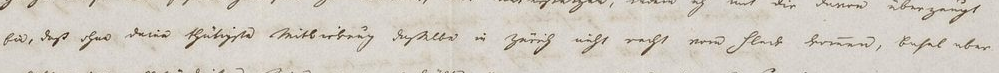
bin, daß ohne Deine thätigste Mitwirkung daßelbe in Zürich nicht recht vom Fleck kommen, Basel aber
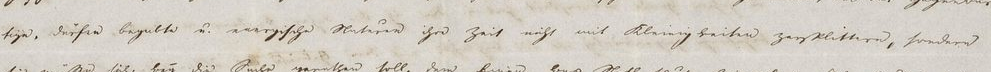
tige, dürfen begabte u. energische Naturen ihre Zeit nicht mit Kleinigkeiten zersplittern, sondern
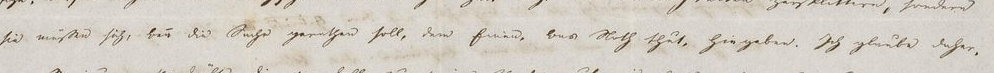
sie müßen sich, wenn die Sache gerathen soll, dem Einen, was Noth thut, hingeben. Ich glaube daher,
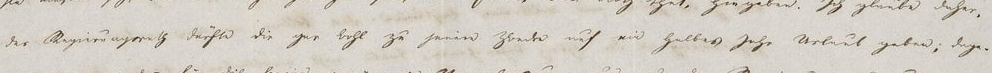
der Regierungsrath dürfte dir gar wohl zu jenem Zwecke auf ein halbes Jahr Urlaub geben; dage-
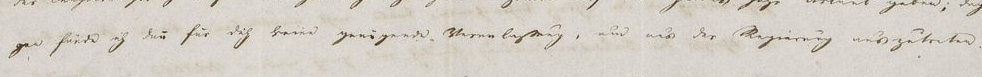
gen fände ich dann für Dich keine genügende Veranlaßung, um aus der Regierung auszutreten.
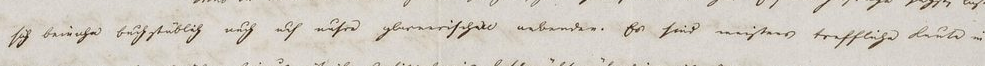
sich beinahe buchstäblich auch auf unsre glarnerischen anwenden. Es sind meistens treffliche Leute in
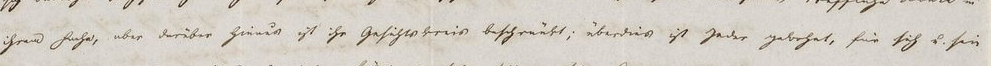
ihrem Fache, aber darüber hinaus ist ihr Gesichtskreis beschränkt; überdies ist Jeder gewohnt, für sich u. sein
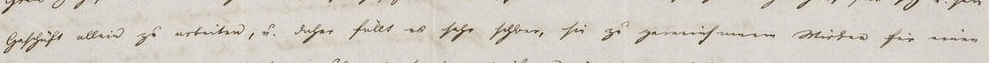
Geschäft allein zu arbeiten, u. daher fällt es sehr schwer, sie zu gemeinsamem Wirken für einen
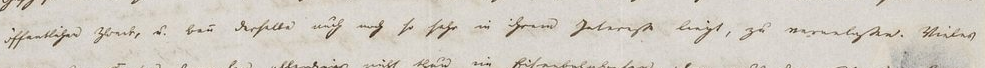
öffentlichen Zweck, u. wenn derselbe auch noch so sehr in ihrem Intereße liegt, zu veranlaßen. Vieles
